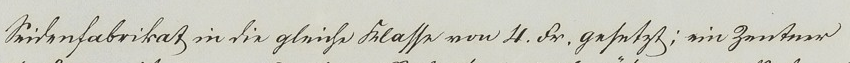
Seidenfabrikat in die gleiche Klasse von 4. Fr. gesetzt; ein Zentner
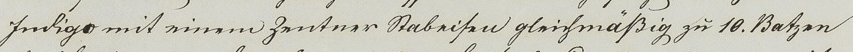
Indigo mit einem Zentner Stabeisen gleichmäßig zu 10. Batzen
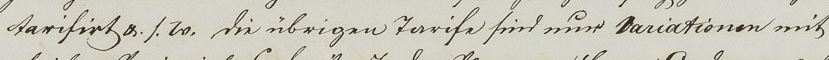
tarifirt u. s. w. die übrigen Tarife sind nur Variationen mit
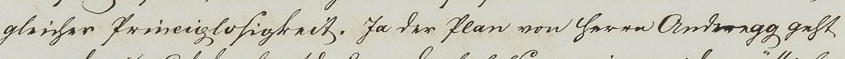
gleicher Principlosigkeit. Ja der Plan von Herrn Anderegg geht
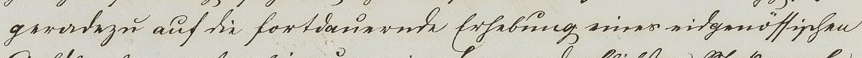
geradezu auf die fortdauernde Erhebung eines eidgenössischen
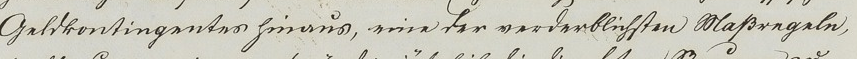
Geldkontingentes hinaus, eine der verderblichsten Maßregeln,
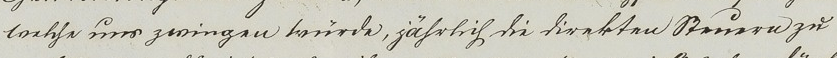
welche uns zwingen würde, jährlich die direkten Steuern zu
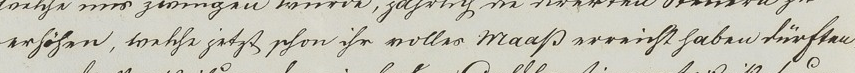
erhöhen, welche jetzt schon ihr volles Maaß erreicht haben dürften.
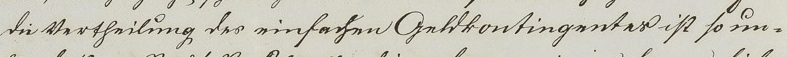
Die Vertheilung des einfachen Geldkontingentes ist so un-
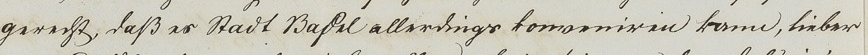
gerecht, daß es Stadt Basel allerdings konveniren kann, lieber
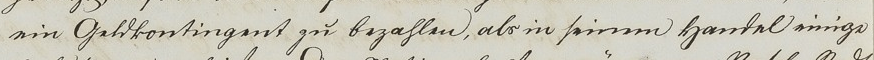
ein Geldkontingent zu bezahlen, als in seinem Handel einige
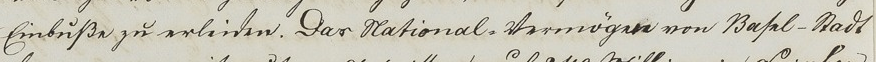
Einbuße zu erleiden. Das National-Vermögen von Basel-Stadt
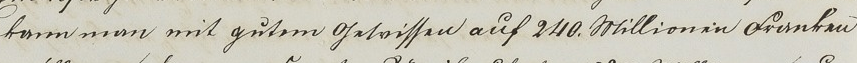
kann man mit gutem Gewissen auf 240. Millionen Franken
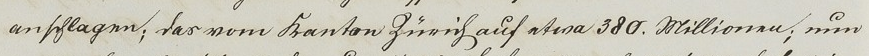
anschlagen; das vom Kanton Zürich auf etwa 380. Millionen; nun
